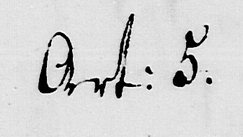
Art: 5.
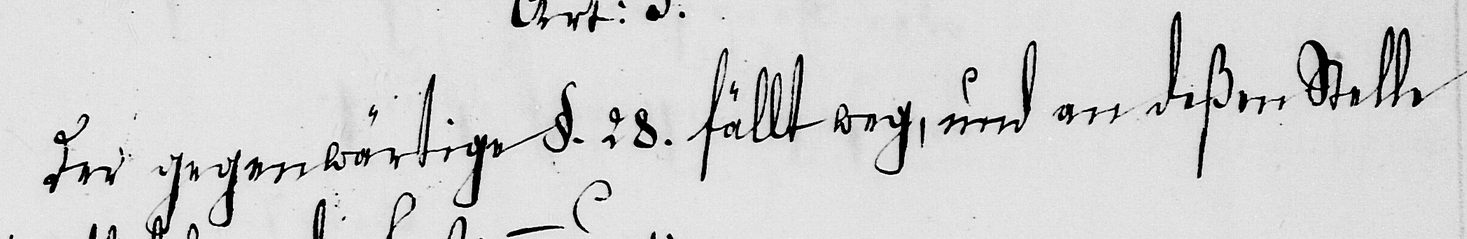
Der gegenwärtige §. 28. fällt weg, und an deßen Stelle
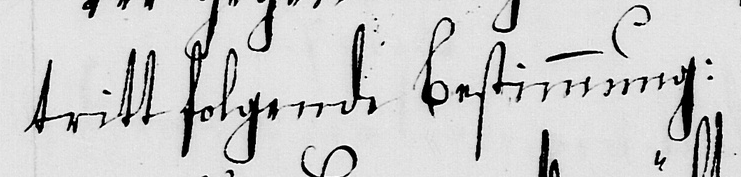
tritt folgende Bestimmung:
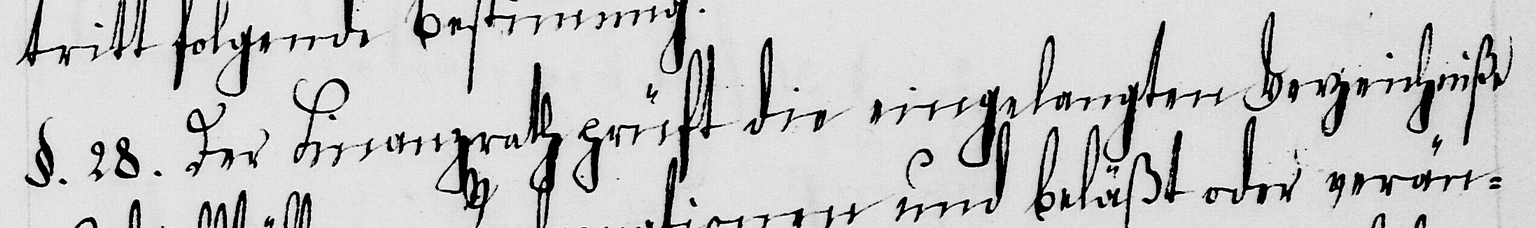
§. 28. Der Finanzrath prüft die eingelangten Verzeichniße
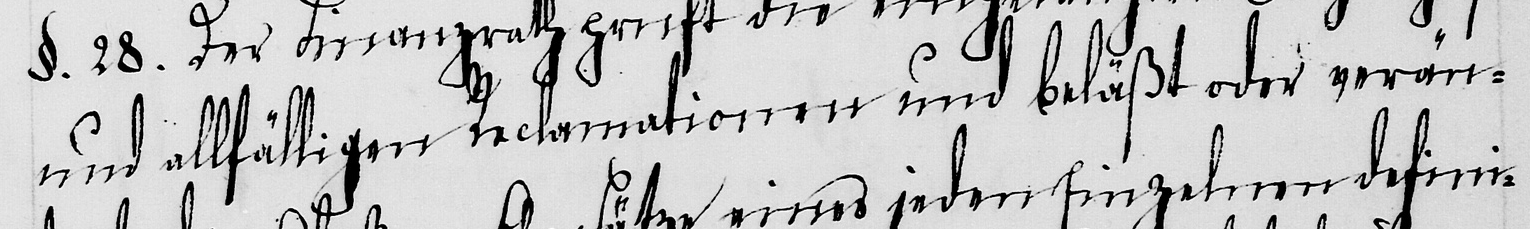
und allfälligen Reclamationen und beläßt oder verän¬
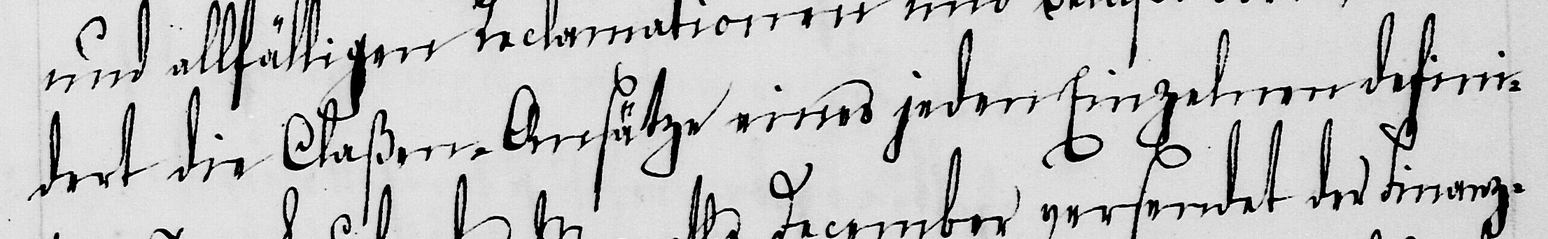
dert die Claßen-Ansätze eines jeden Einzelnen defini¬
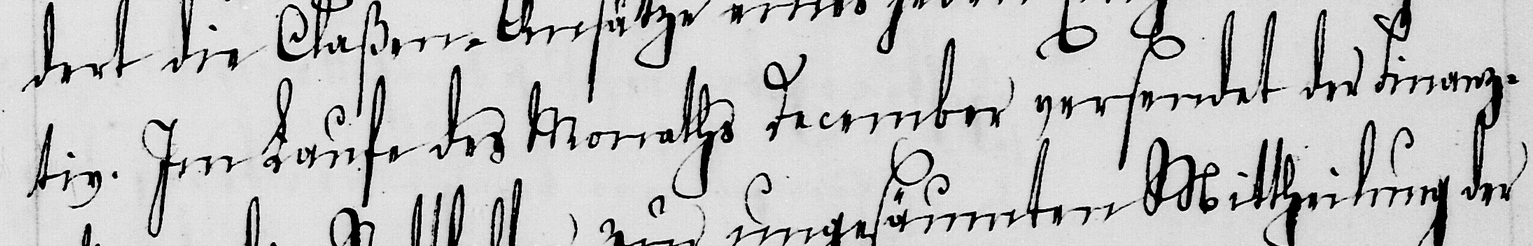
tiv. Im Laufe des Monaths December versendet der Finanz¬
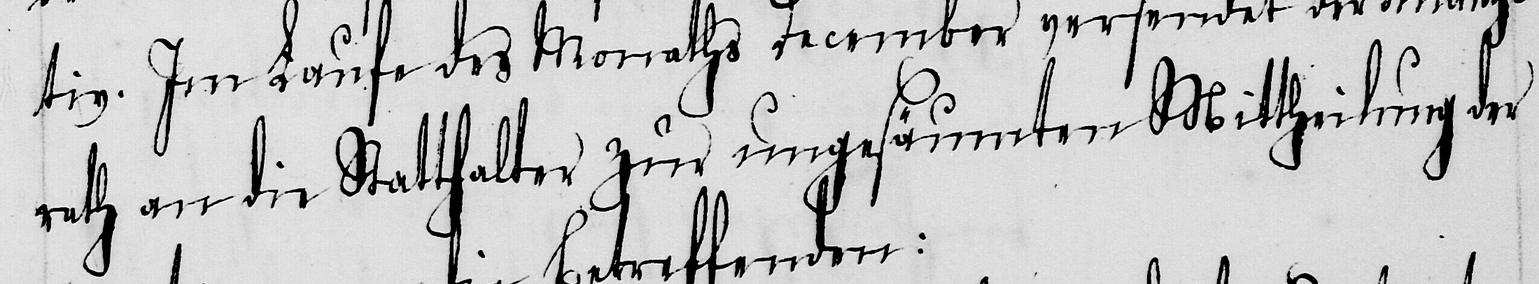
rath an die Statthalter zur ungesäumten Mittheilung der
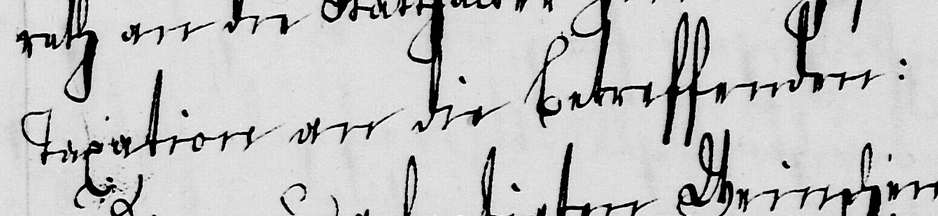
Taxation an die Betreffenden:
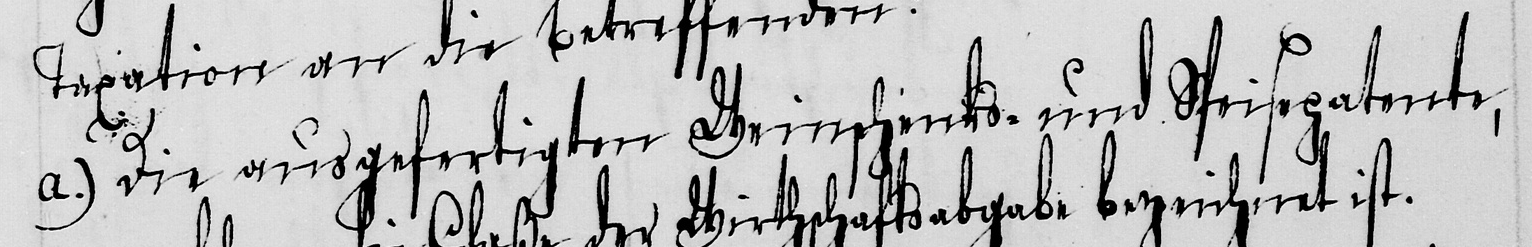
a.) Die ausgefertigten Weinschenks- und Speisepatente,
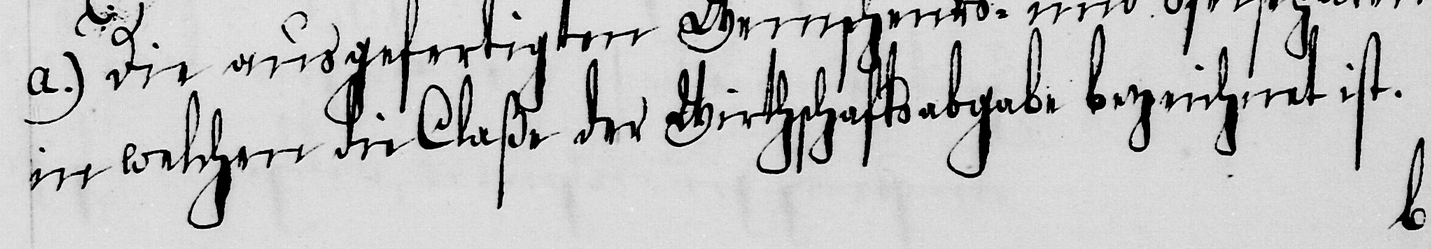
in welchen die Claße der Wirthschaftsabgabe bezeichnet ist.
